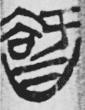智（知）
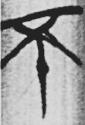不
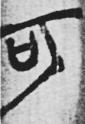可
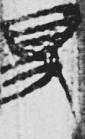○（得）
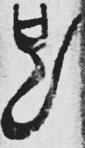也
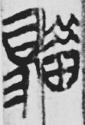鵲
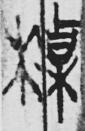樔（巢）
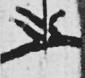之
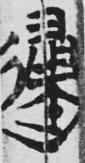歸
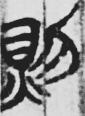則（則）
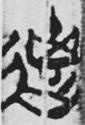○（離）
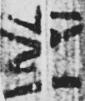者
